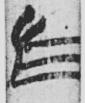於
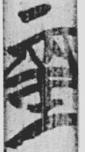坪（平）
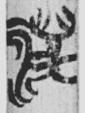澫（厲）
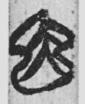因
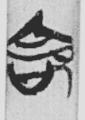命（令）
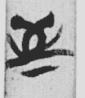至（致）
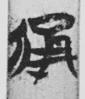俑（庸）
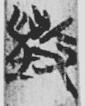毀
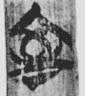室
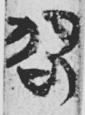卲（昭）
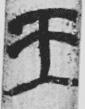王
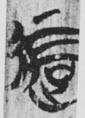○（蹠）
